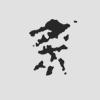𬒵
